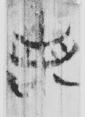若
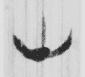山
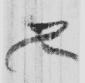氒
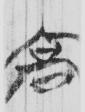高
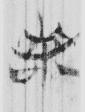若
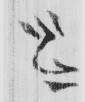水
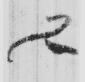氒
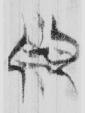𣶒
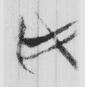女
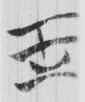玉
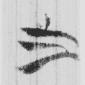之
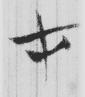才
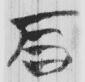石
